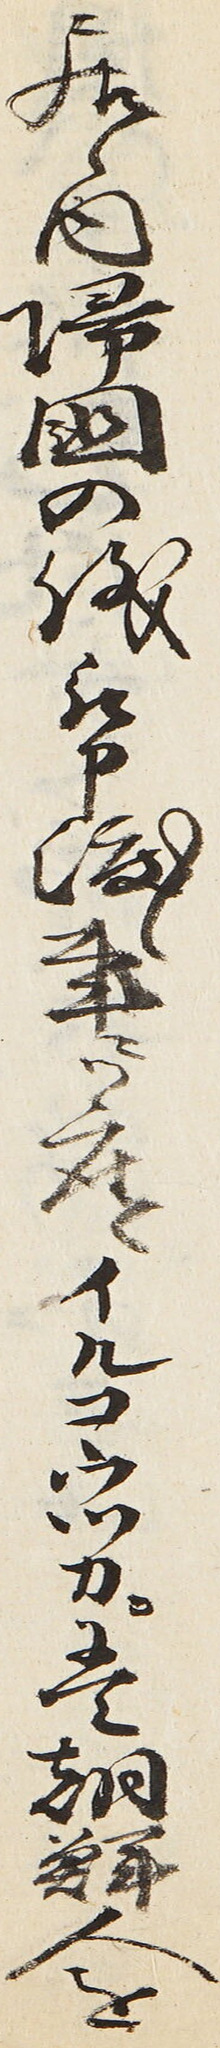居候内貴国の儀被申渡候事に御座候イルコウツカ。にて朝鮮人を
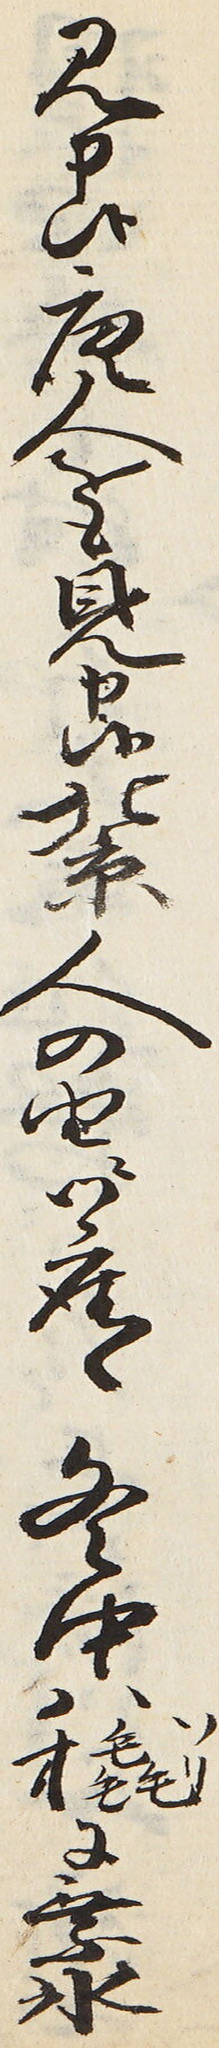見申候唐人をも見申候北京人の由に御座候冬中は橇に乗氷
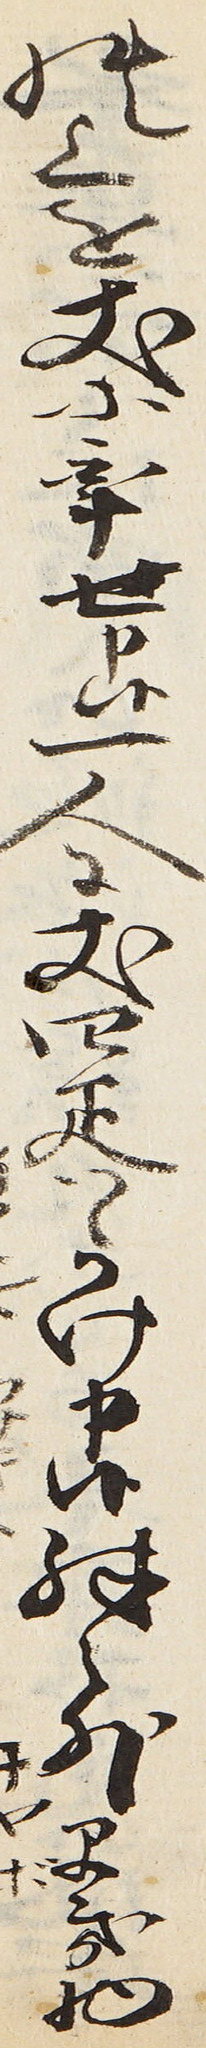の上を犬に率せ申候一人に犬四疋つゝかけ申候殊之外早き物
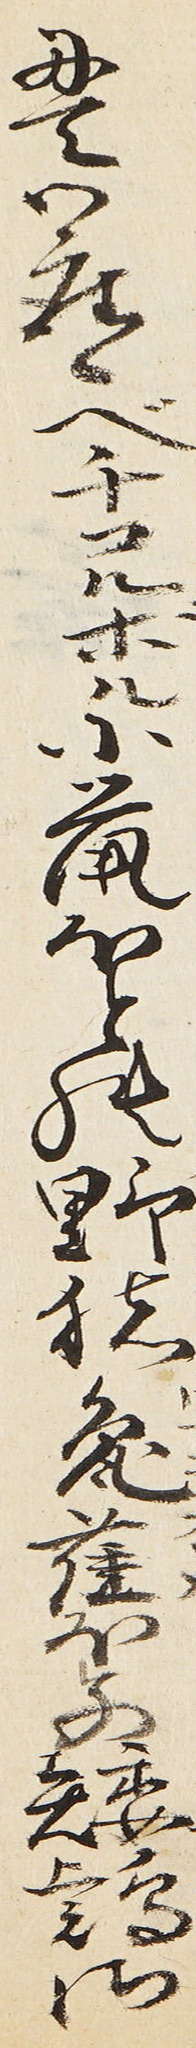にて御座候ベチコルボルに鼠ほとの野猪兎雀ほとの矮鶏御
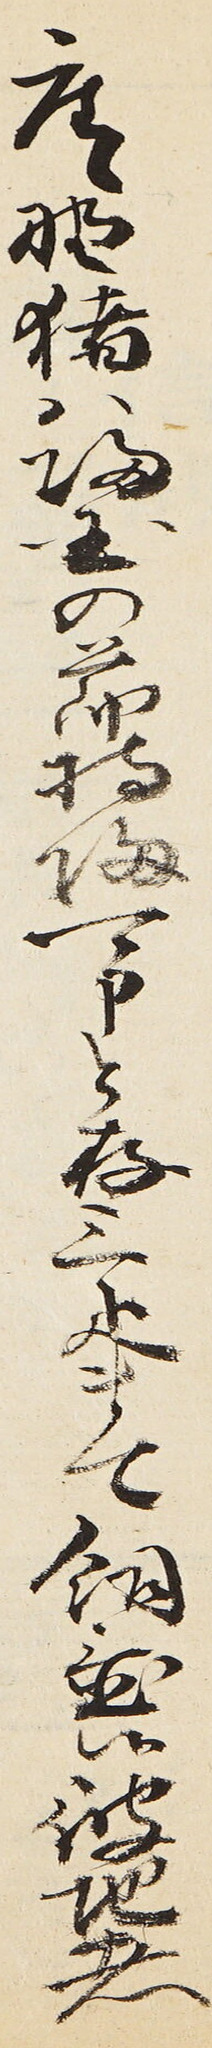座候野猪は帰国の節持帰可申と存三疋まて飼置候彼地者
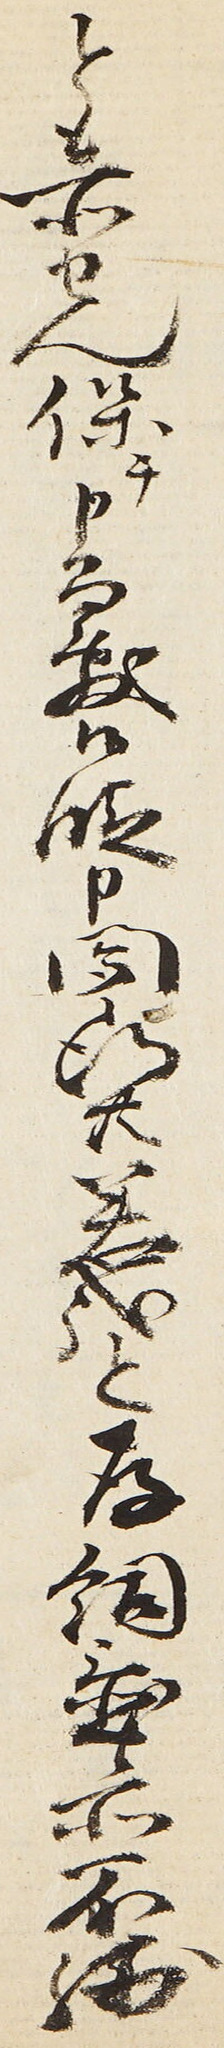とも所せん保ち申間敷候段申聞候得共若哉と存飼置所不残
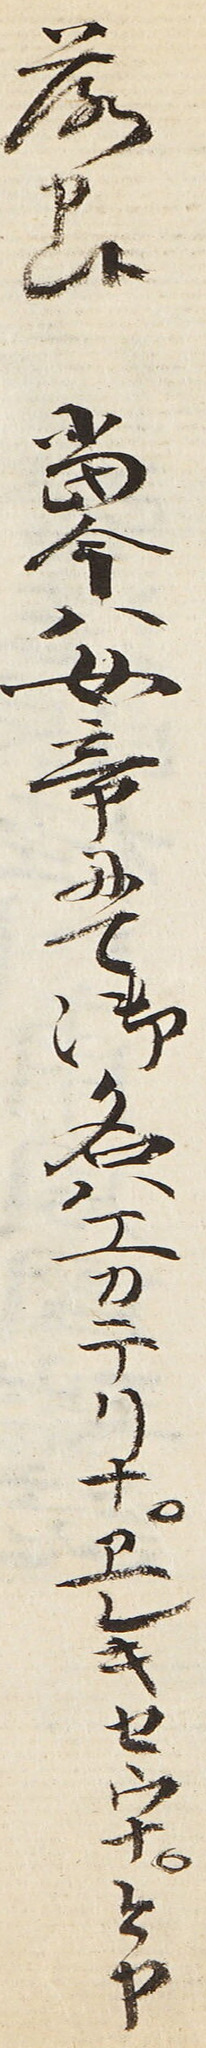落申候当今は女帝にて御名はエカテリナ。ヱレキセウナ。と申
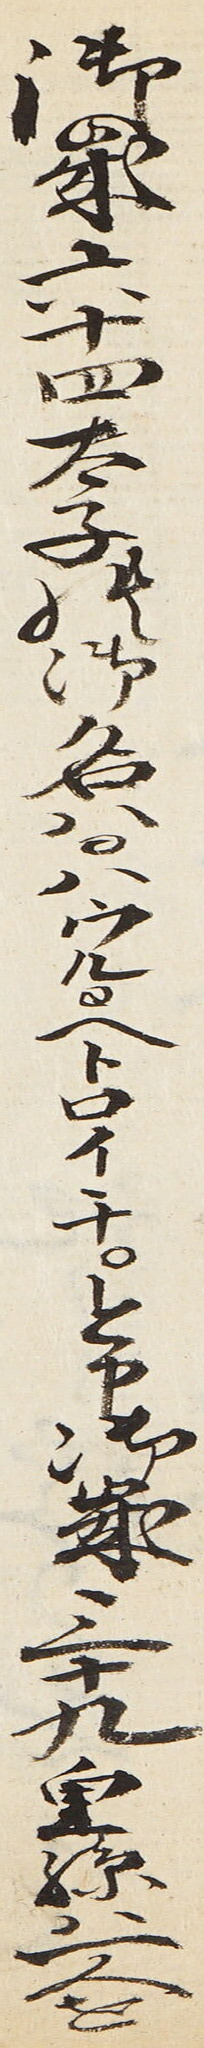御歳六十四太子の御名は。ハウル。ヘトロイチ。と申御歳三十九皇孫は一人を
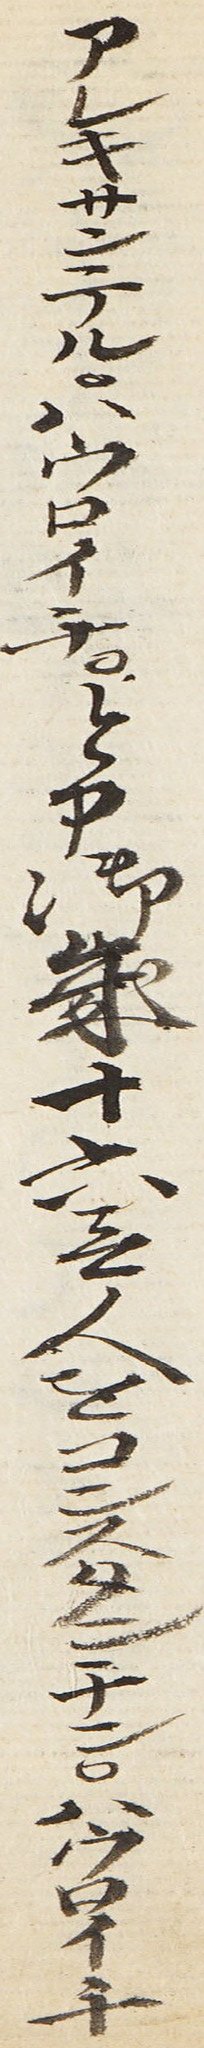アレキサンテル。ハウロイチ。と申御歳十六壱人をコンスタンチン。ハウロイチ
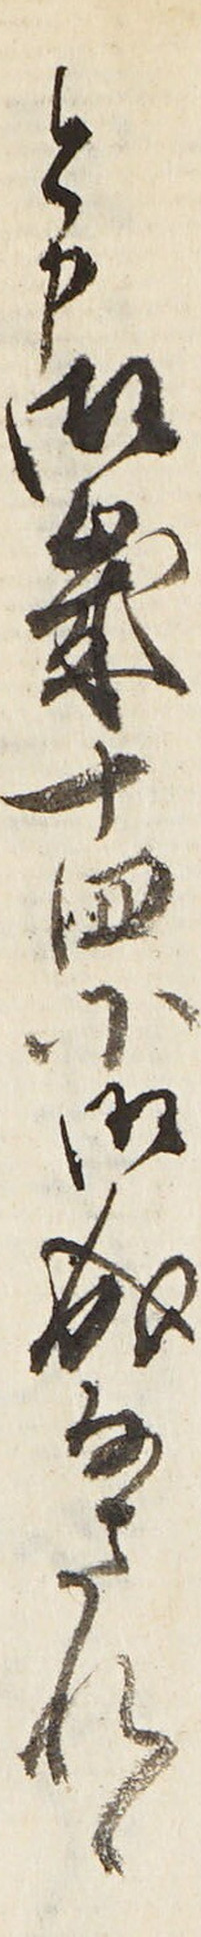と申御歳十四に御成なされ候

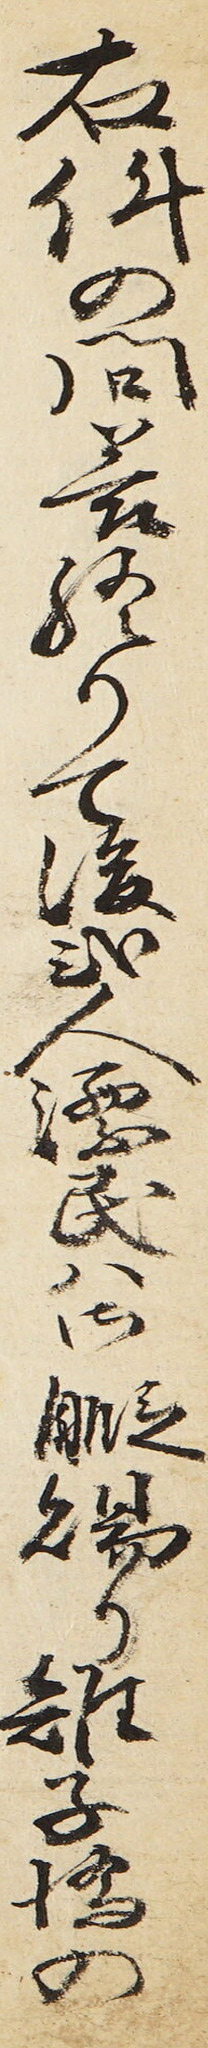右件の問答終りて後弐人漂民は御暇賜り雉子橋の
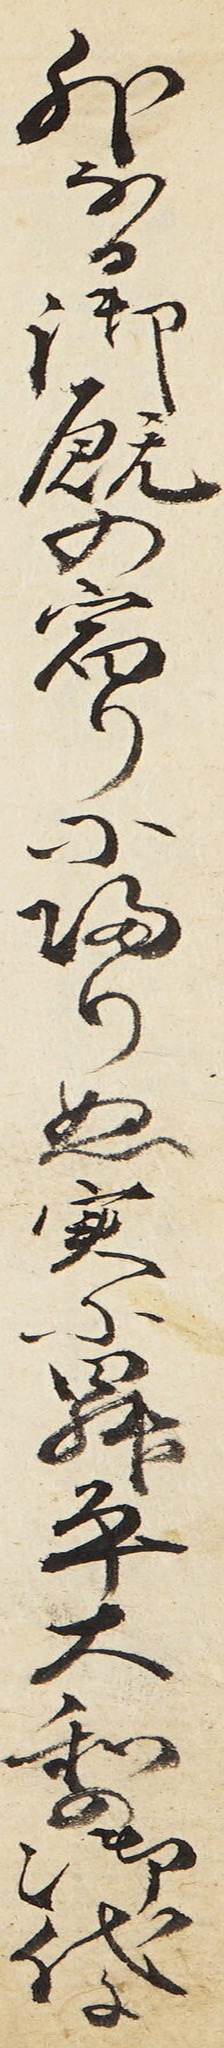外なる御厩の宿りに帰りぬ実に昇平大和の御代に
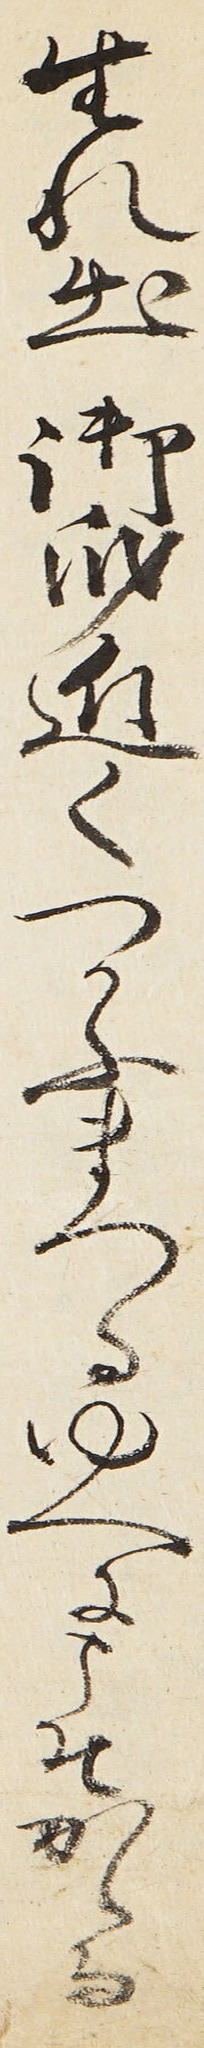生れ出御身近くつかふまつるゆへにこそかゝる
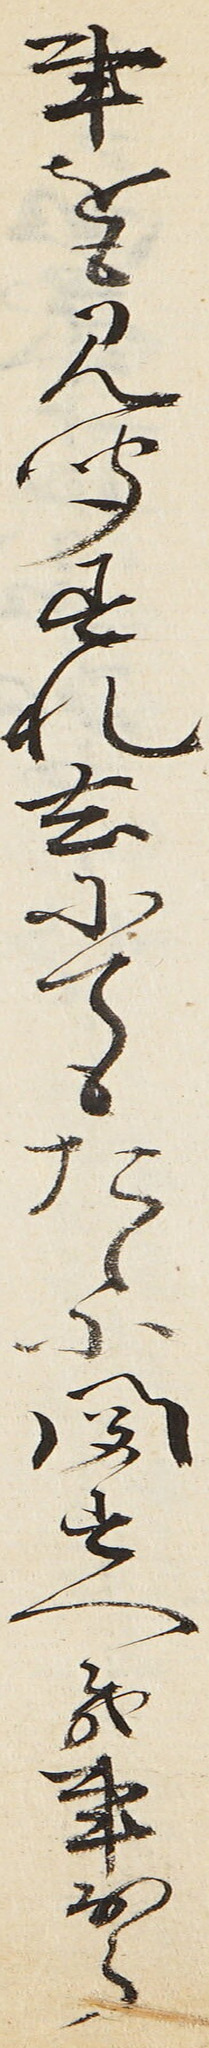事をも見聞すれ去にてもたゝに聞すへき事なら
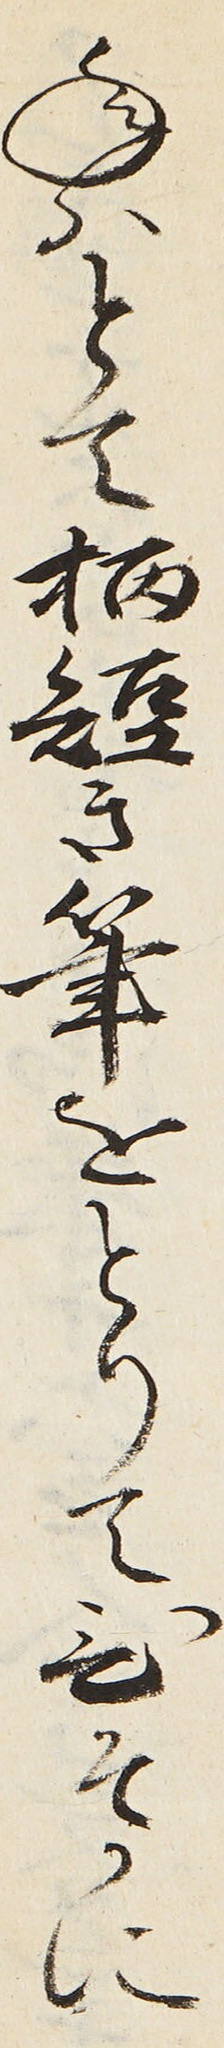ねはとて柄短き筆をとりてひそかに
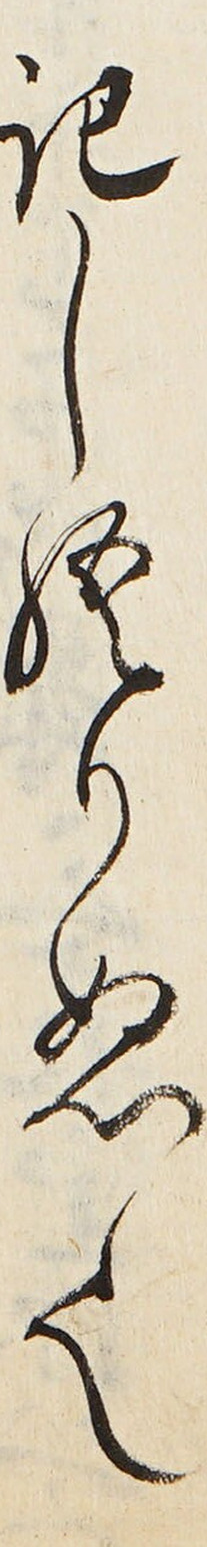記し終りぬ也
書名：漂民御覧之記
